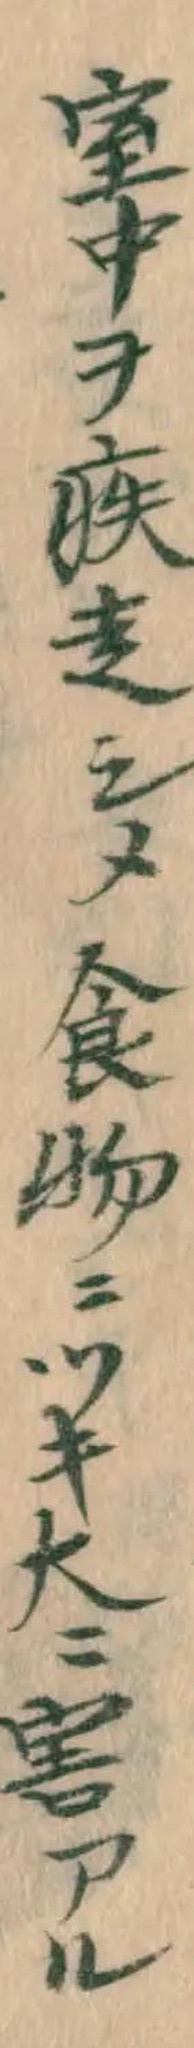室中ヲ疾走シシテ食物ニツキ大ニ害アル
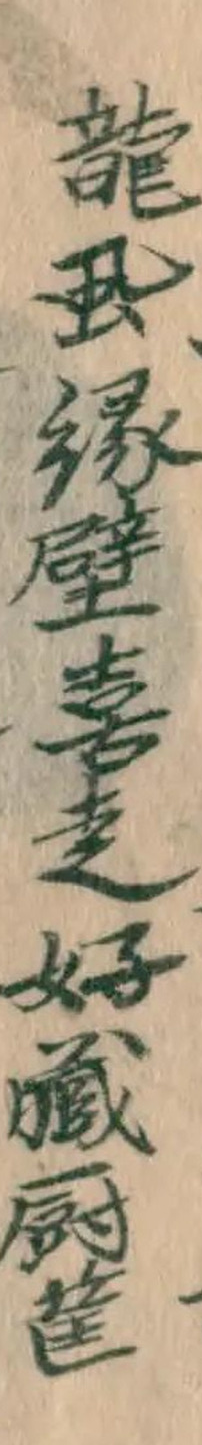龍虱縁壁喜走好藏厨筐
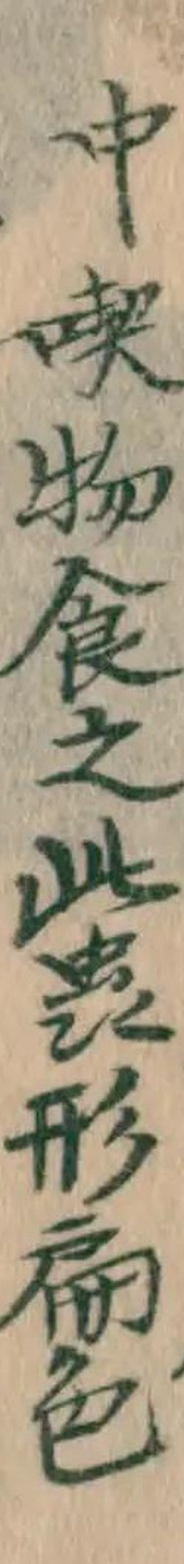中喫物食之此蟲形扁色
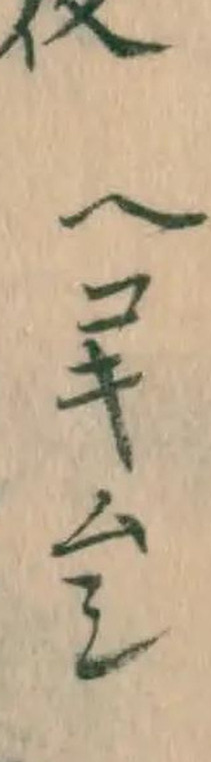ヘコキムシ
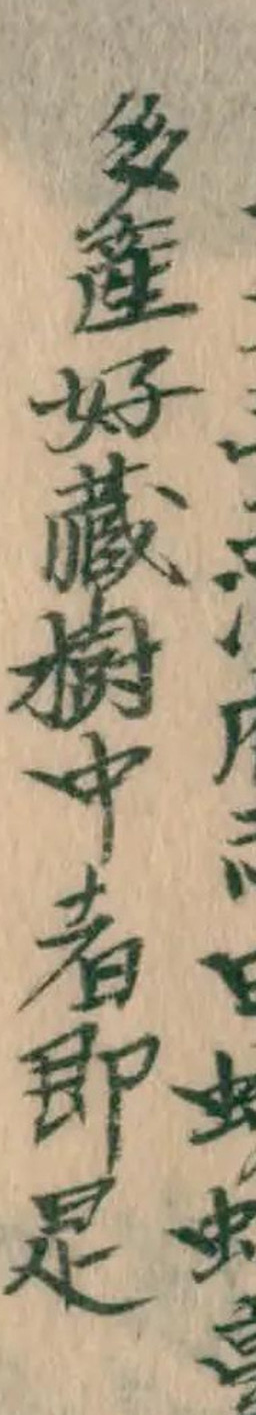多産好藏樹中者即是
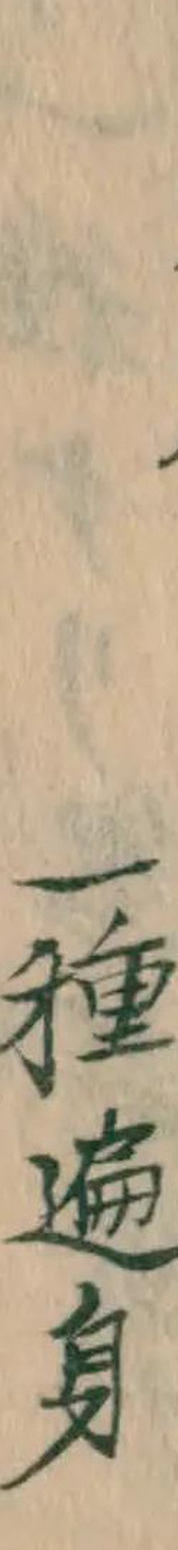一種遍身
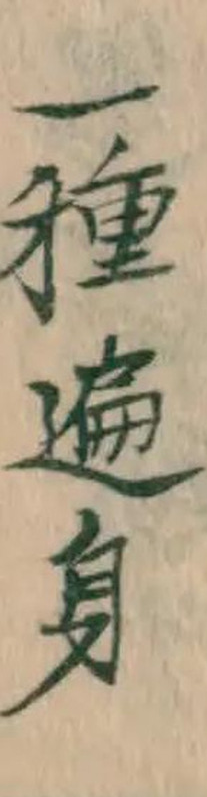一種遍身
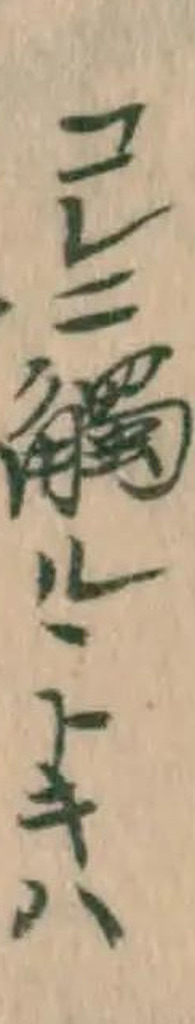コレニ觸ルヽトキハ
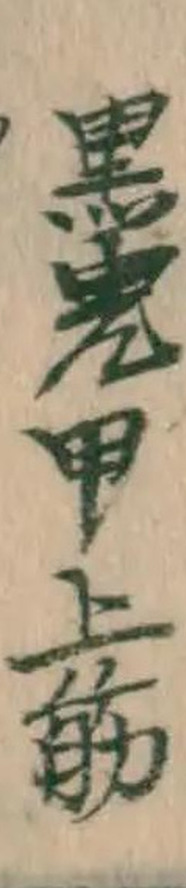黒光甲上筋
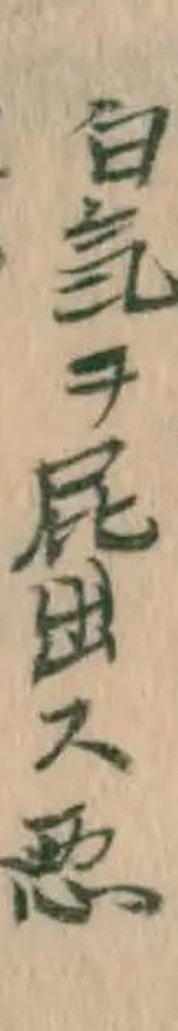白気ヲ屁出ス悪
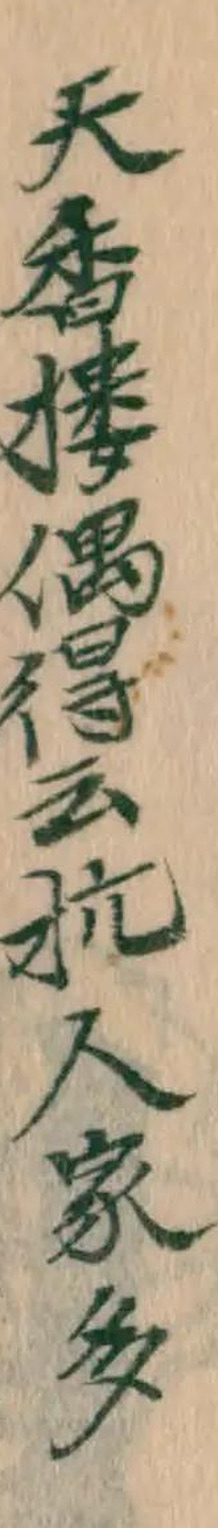天香楼偶得云杭人家多
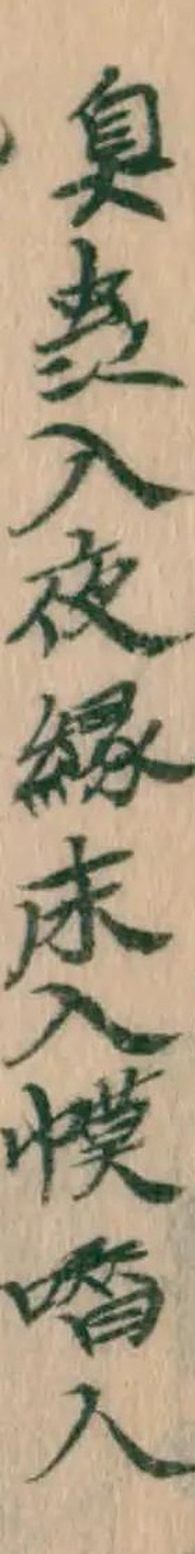臭蟲入夜縁床入幙噆人
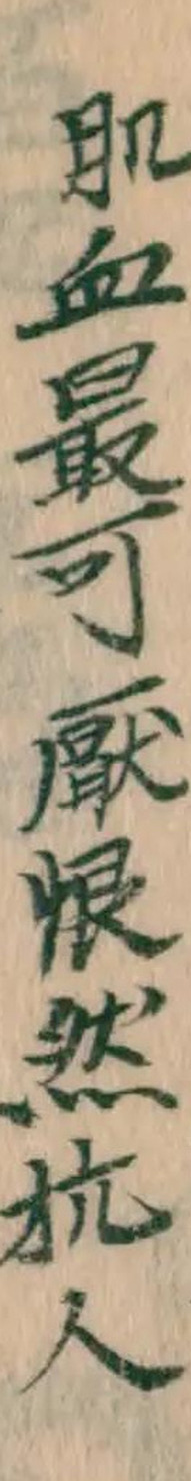肌血最可厭恨然杭人
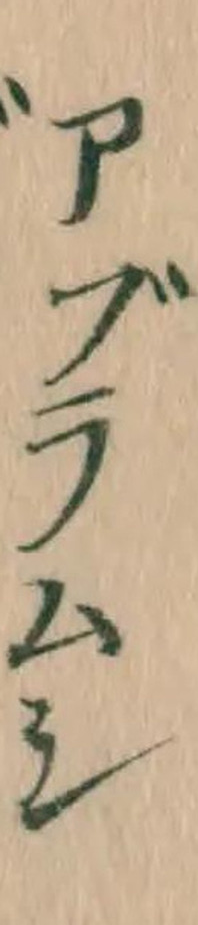アブラムシ
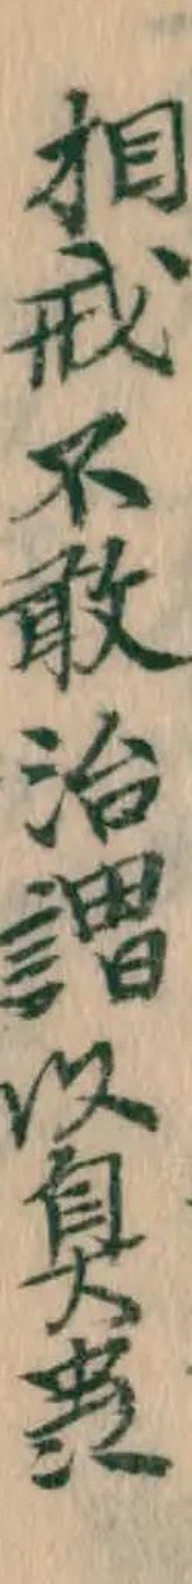相戒不敢治謂以臭蟲
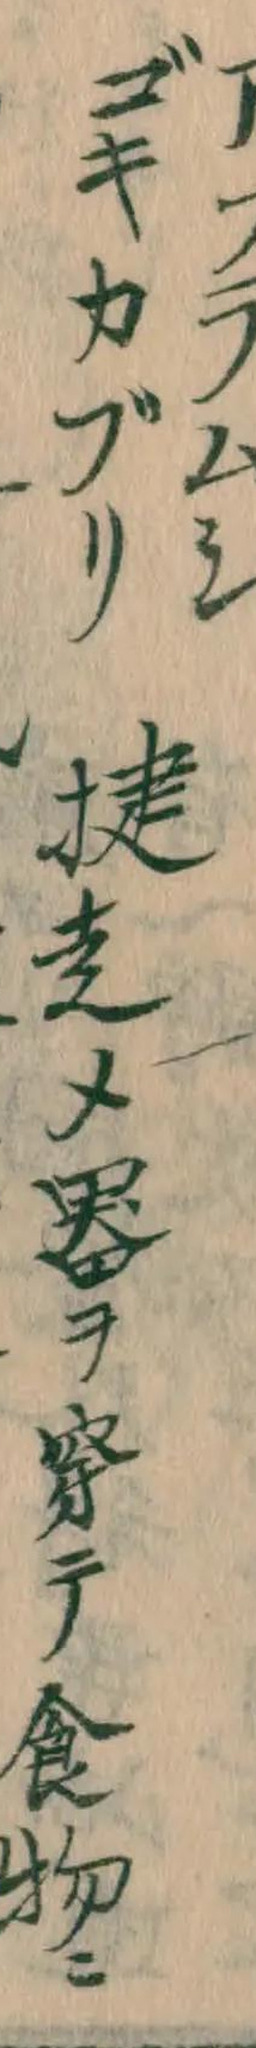ゴキカブリ捷走シテ器ヲ穿テ食物ニ
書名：千蟲譜 3巻. [1]
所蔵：国立国会図書館 National Diet Library, JAPAN
